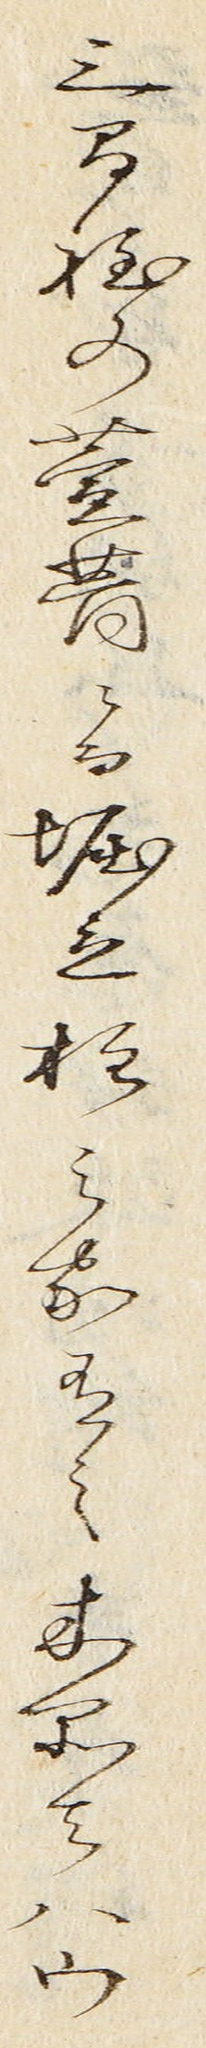三間程の萱葺に而掘立柱之家有之木品はハウ
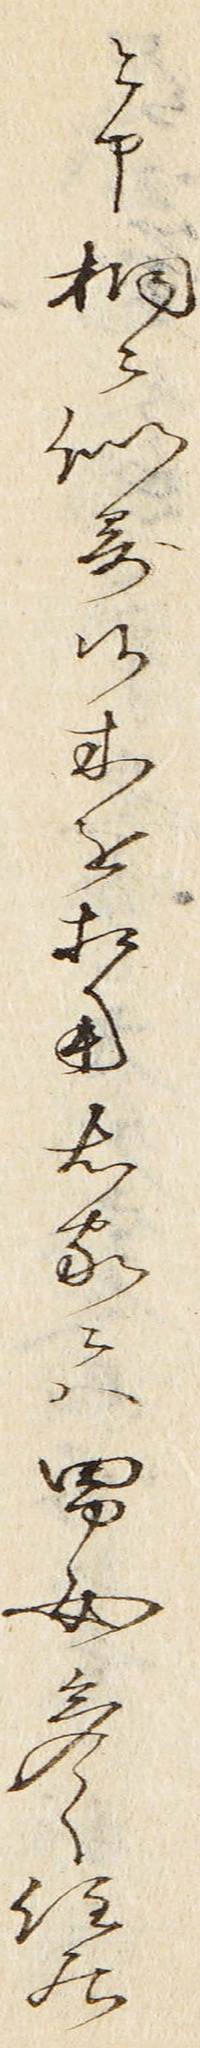と桐に似寄候木を相用右家には男女多く住居
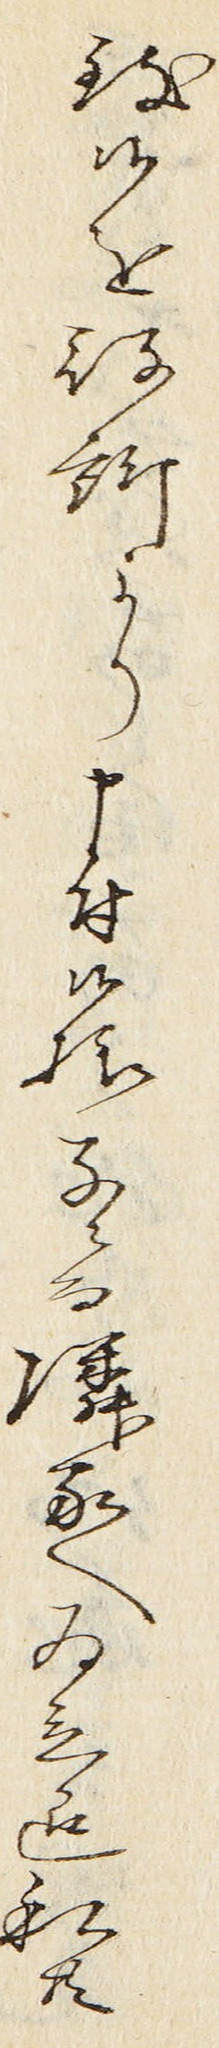致候を役所より申付候様子に而隣家へ為立退私共
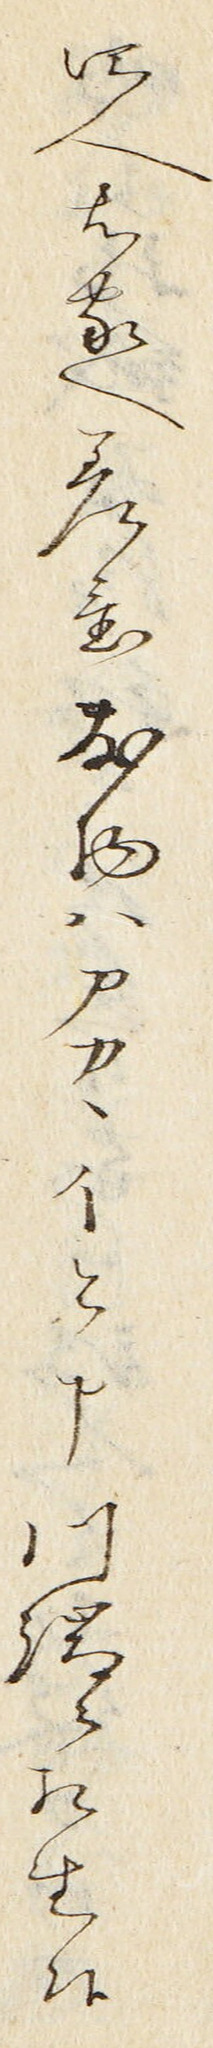四人右家へ差置敷物はアカヽイと申川端に相生候
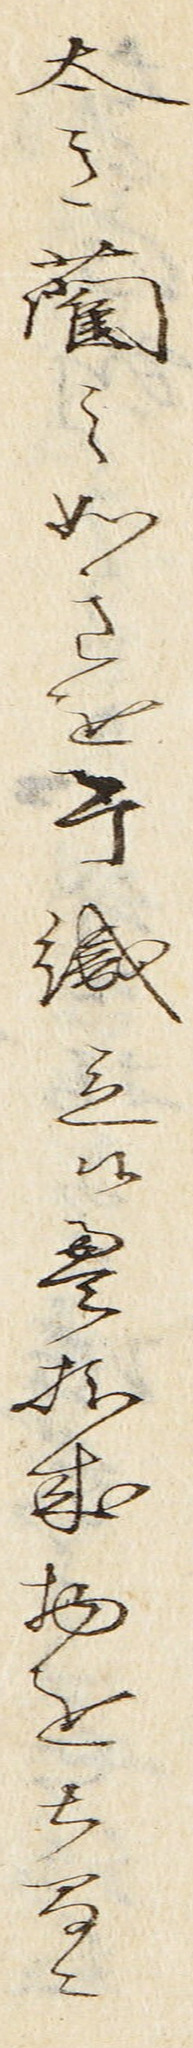太き藺之如きを干織立候畳様成物を土間に
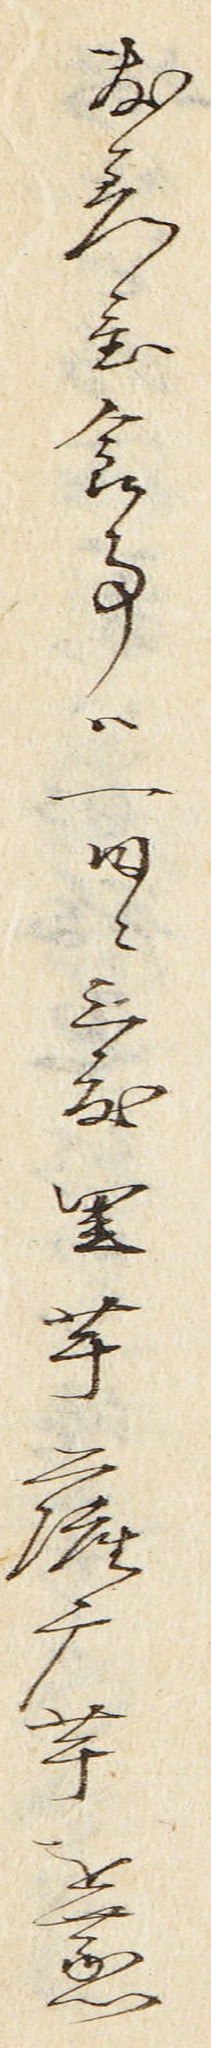敷差置食事は一日三度里芋薩摩芋を蒸

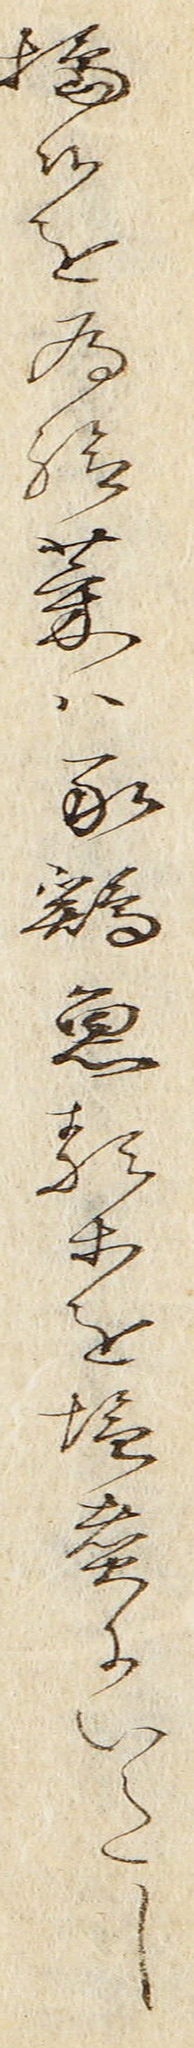搗候を為給菜は豕鶏魚類等を塩煮にいたし
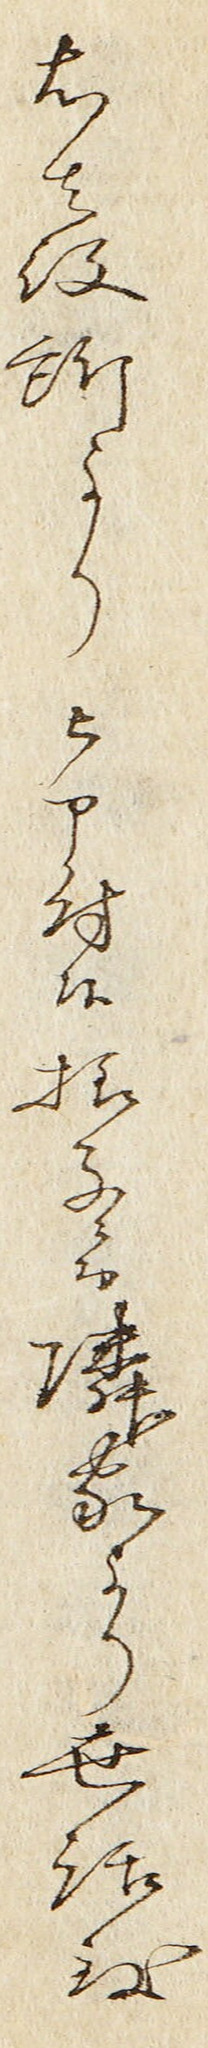右は役所より被申付候様子に而隣家より世話致
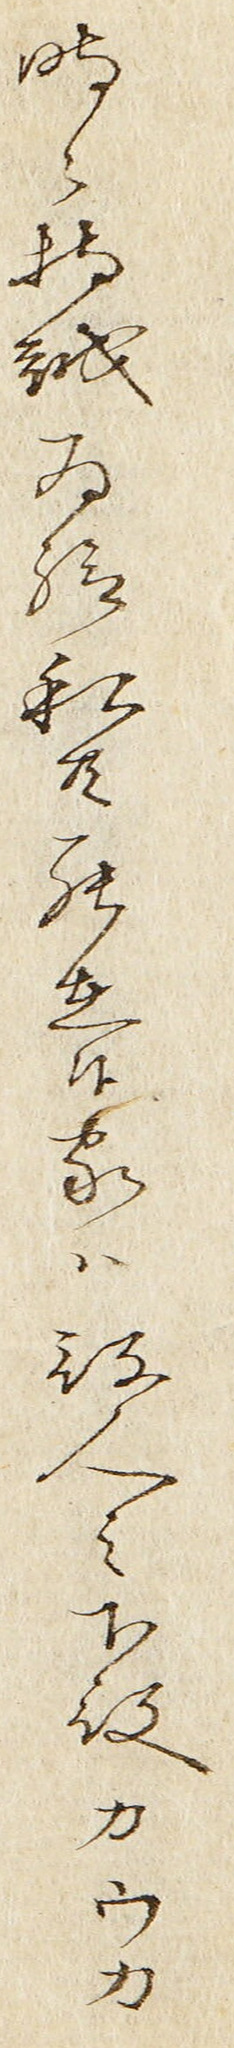時々持越為給私共罷在候家は役人之下役カウカ
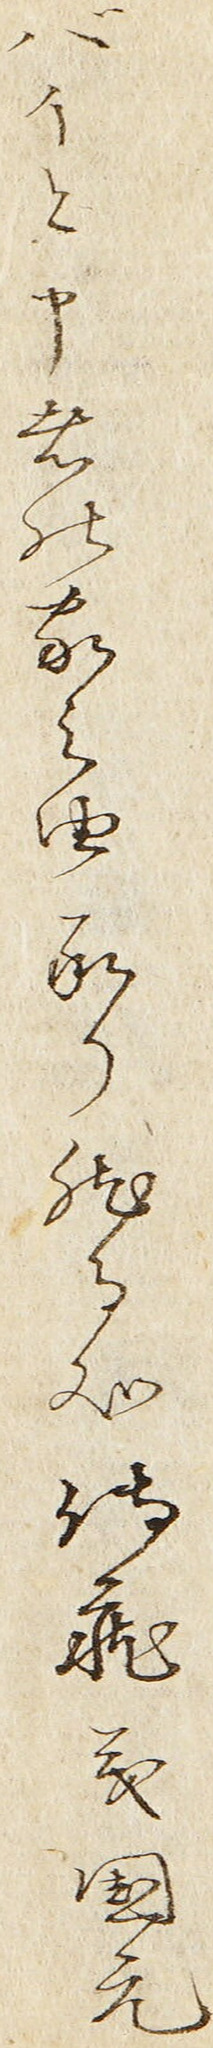バイと申者の家之由承り然る処で伝蔵義国元
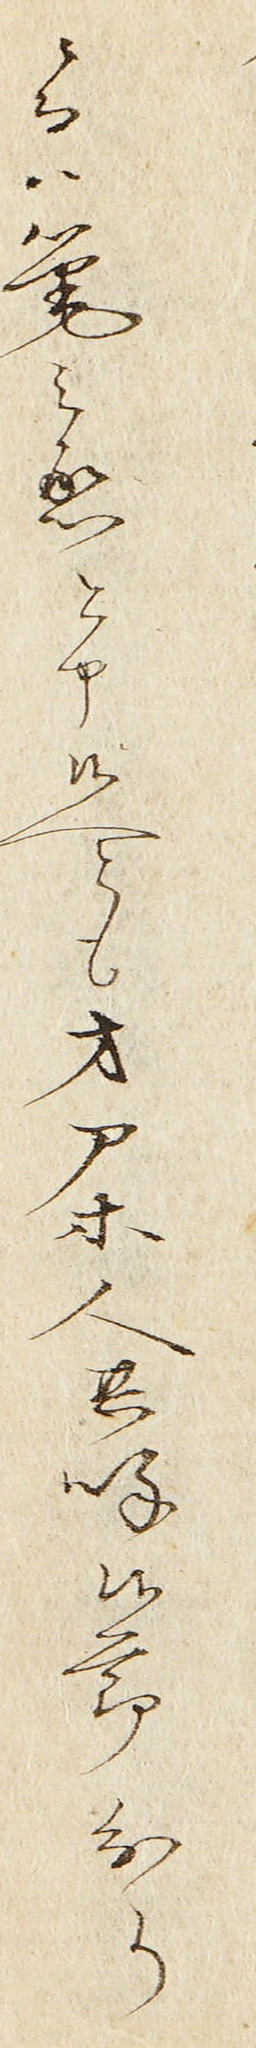に而は筆之丞と申候へともオアホ人共呼候節分り
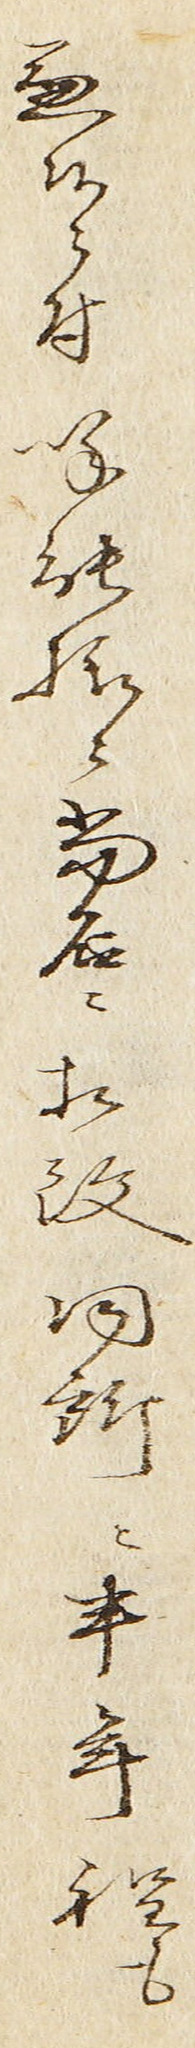兼候に付呼能様に当名に相改同所に半年程も
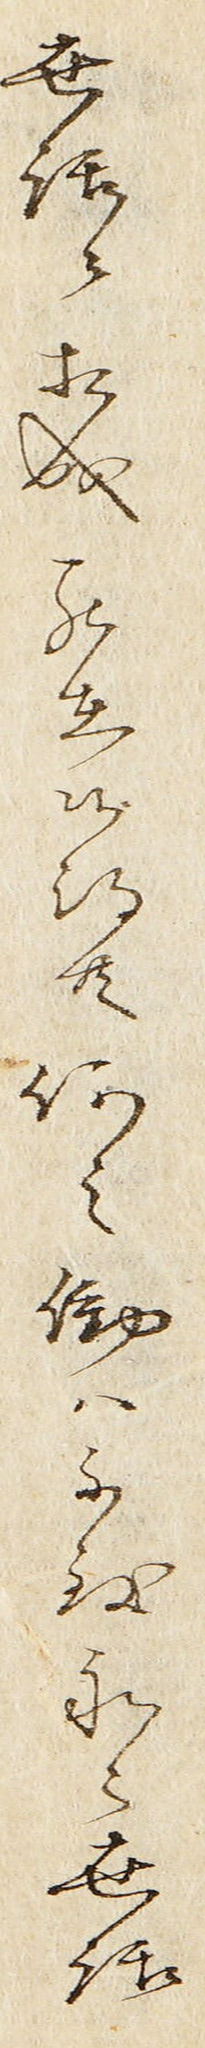世話に相成罷在候得共何之働は不致相永々世話
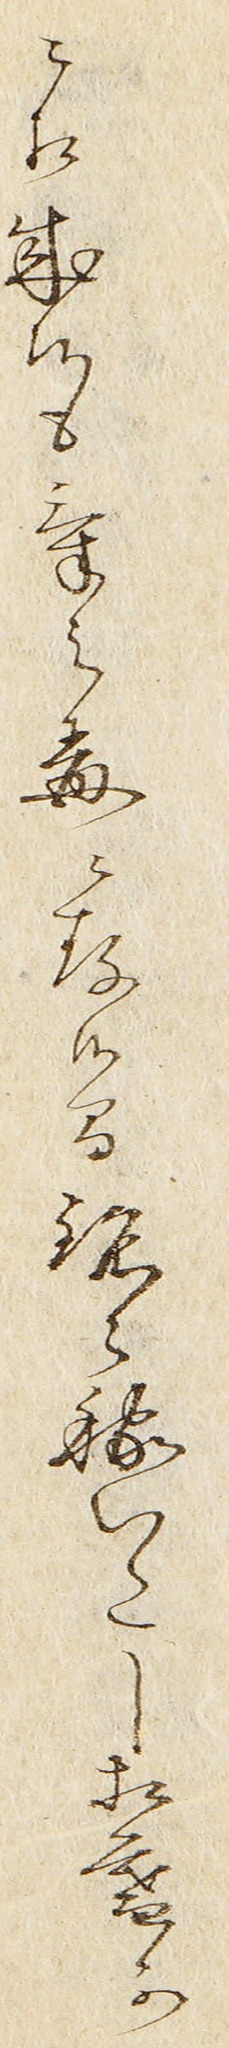に相成候も気之毒に存候間銘々の稼いたし相暮可
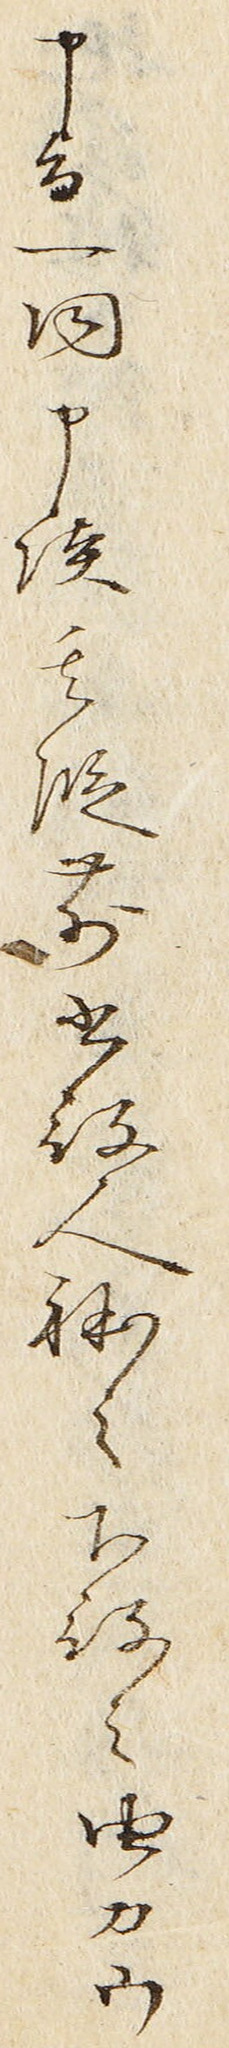申旨一同申談其段前書役人躰之下役之由カウ
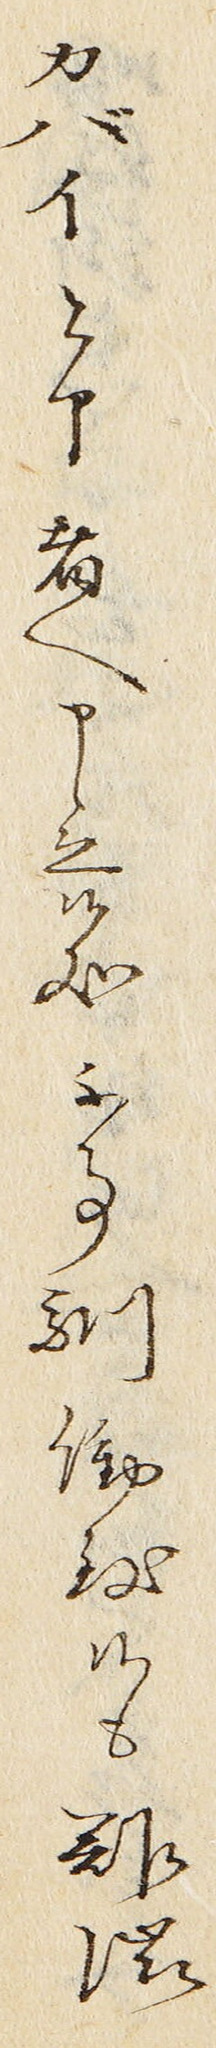カバイと申者へ申立候処不事馴働致候も難渋
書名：土佐中浜万次郎漂流記
